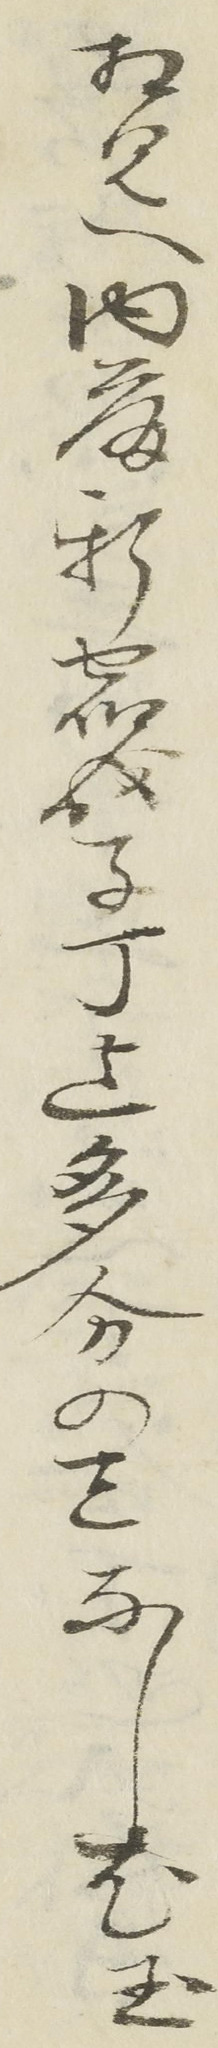相見へ内藤新宿成子丁迄多分のことなし尤玉
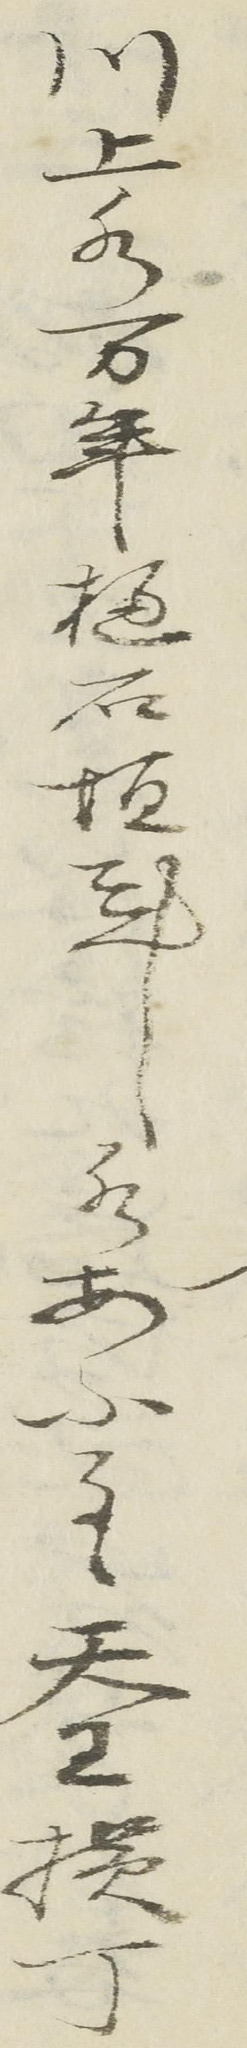川上水万年樋石垣そんし水あふるゝ天王横丁
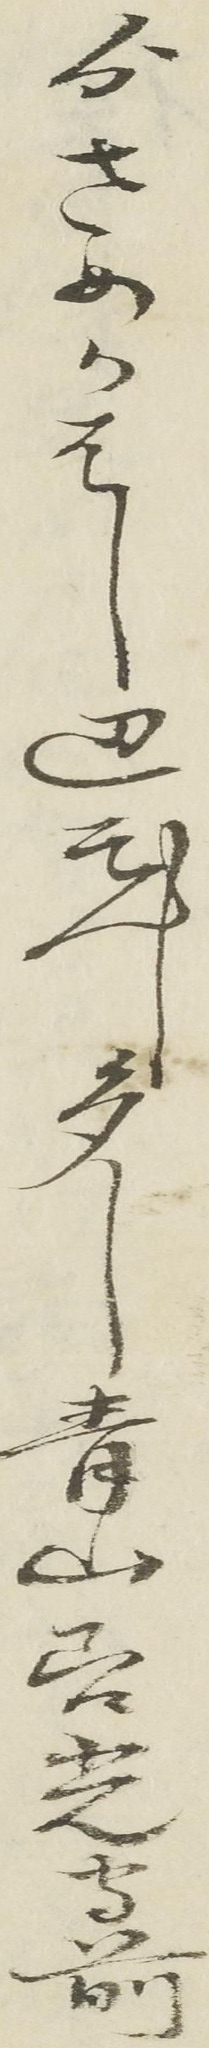ゟさめかはし辺そんし多し青山善光寺前
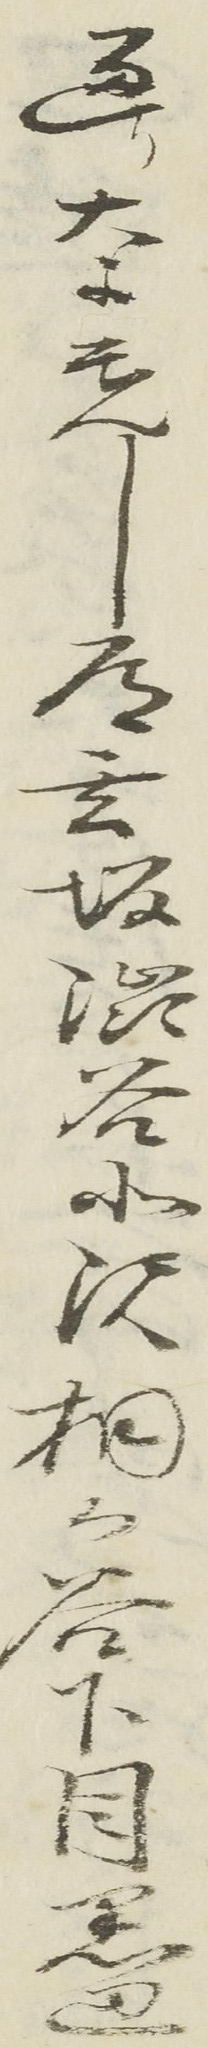通り大にそんし道玄坂渋谷北沢桐ケ谷下目黒辺
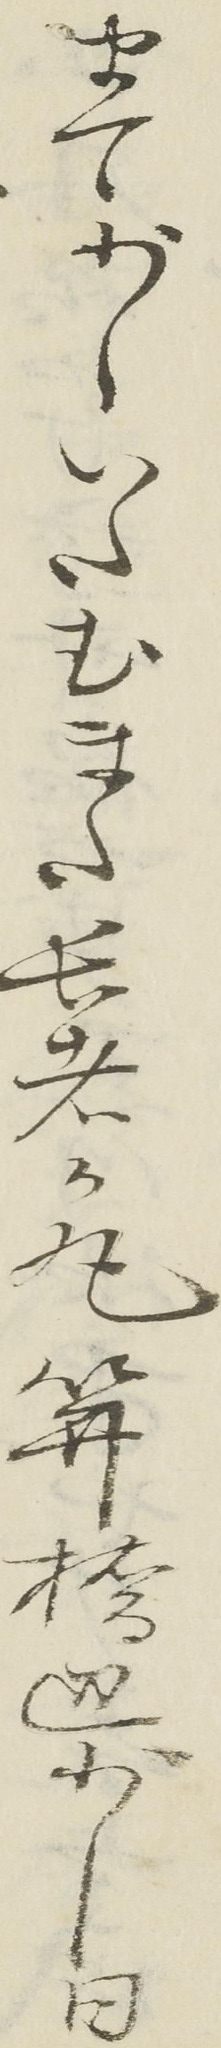まて少しいたむまた長者か丸笄橋辺少し日
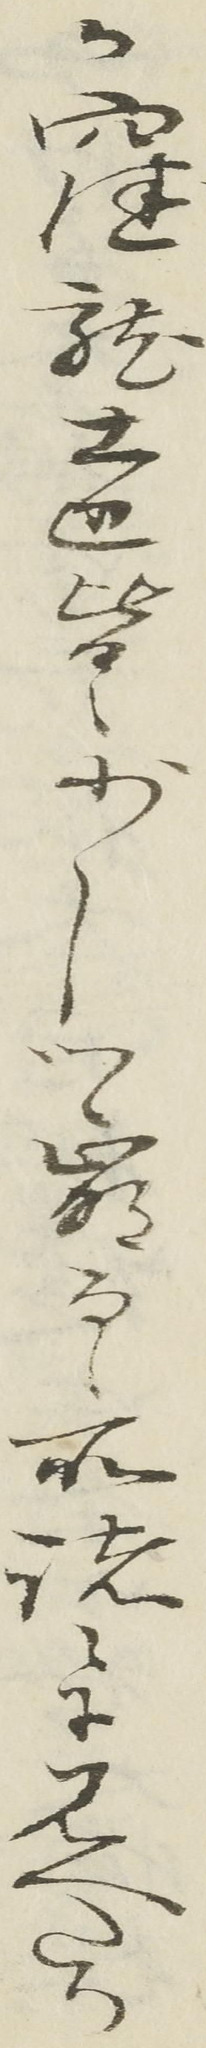か窪龍土辺皆々少しつゝ崩るゝ所諸々に見へたり
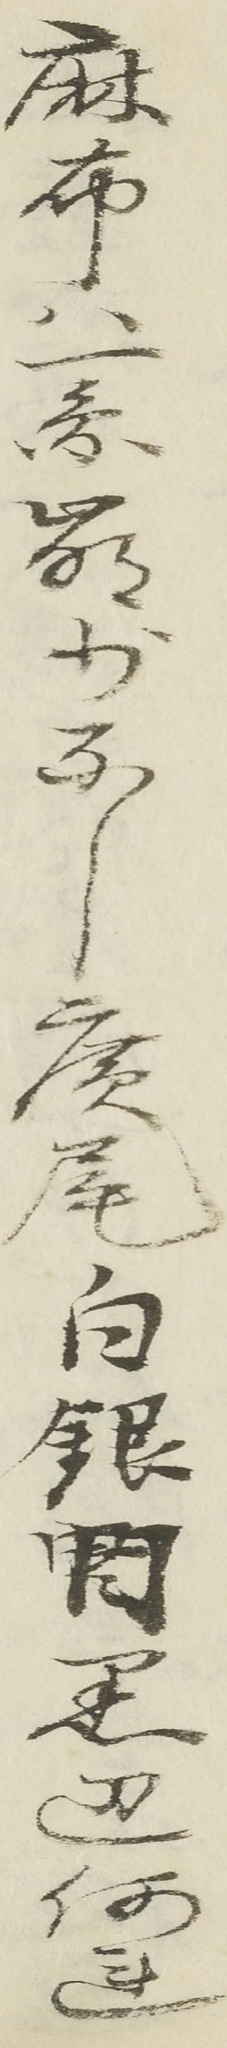麻布ハ一円崩少なし広尾白銀目黒辺何れ
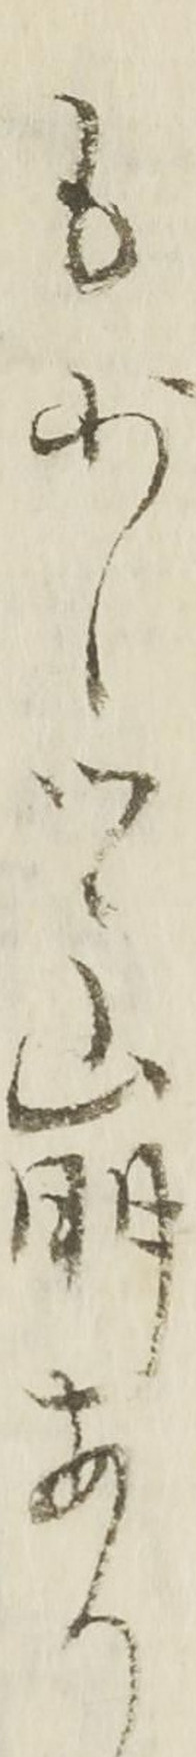も少しつゝ崩あり
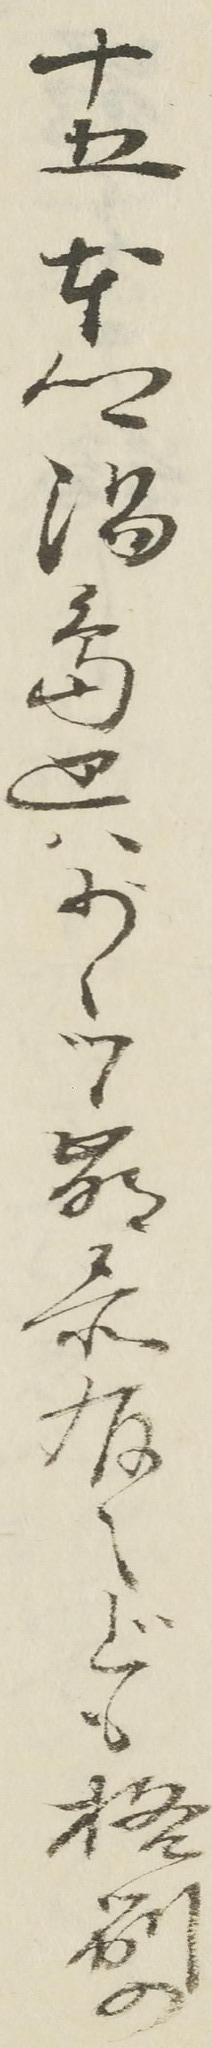十五本郷湯島辺ハ少しつゝ崩る所有之ども格別の
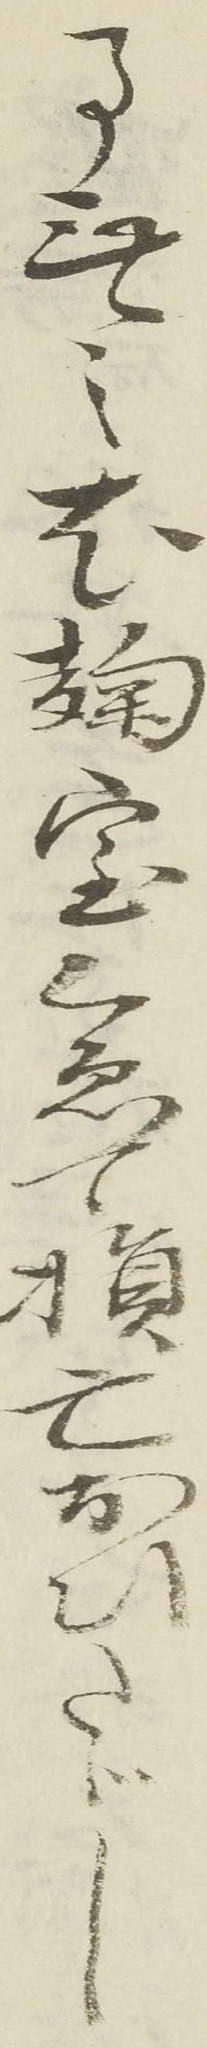事無之尤麹室こゑて損亡おひたゞし
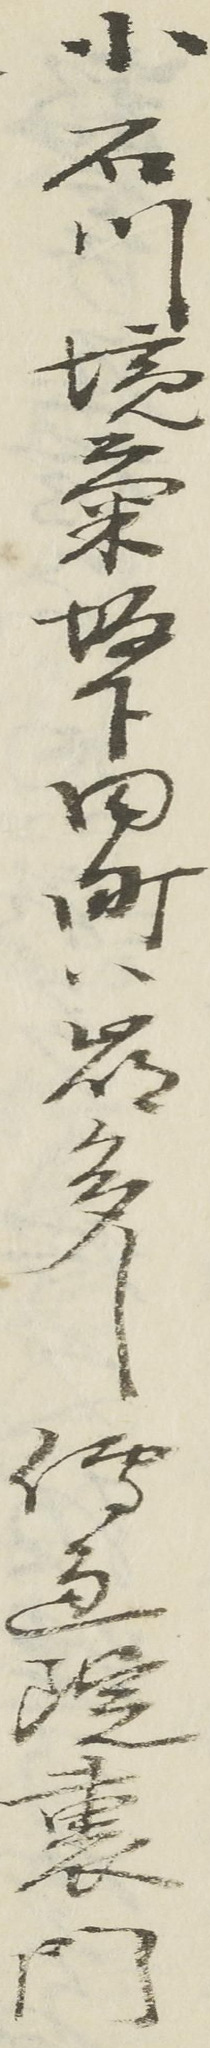小石川境粂坂下田町ハ崩多し伝通院裏門
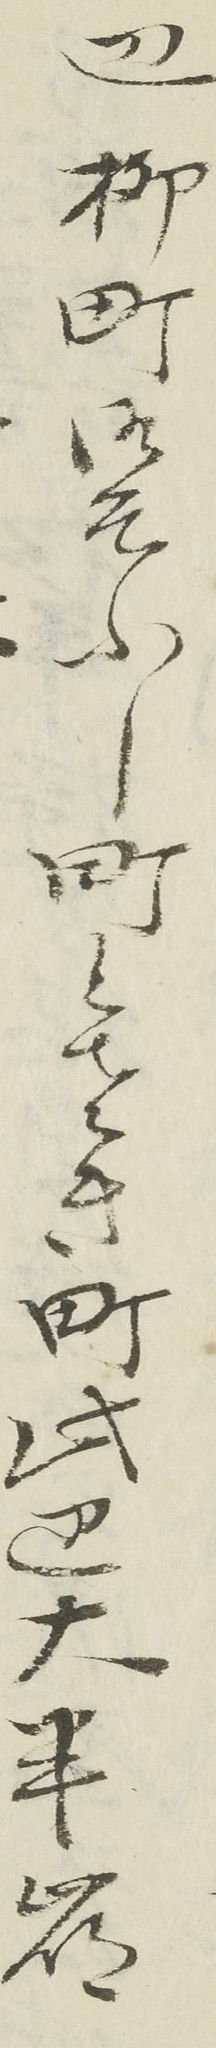辺柳町御そふし町とさき町此辺大半崩
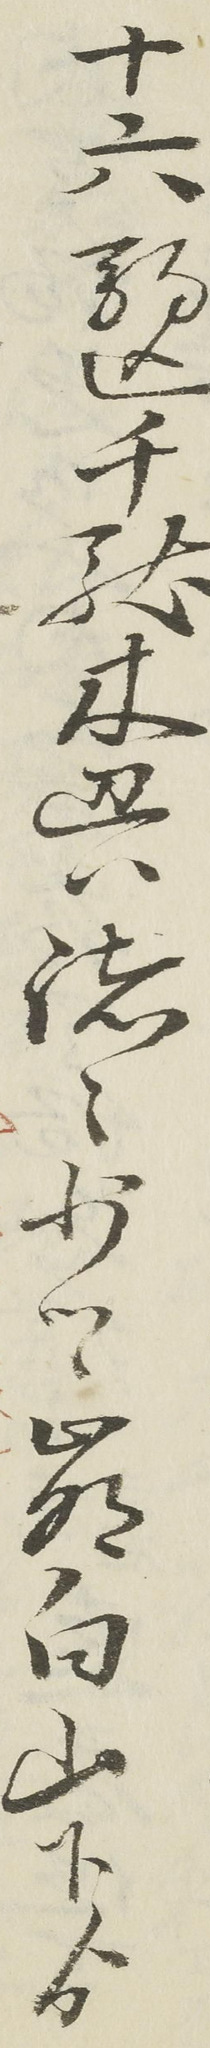十六駒込千駄木辺ハ諸々少しつゝ崩白山下ゟ
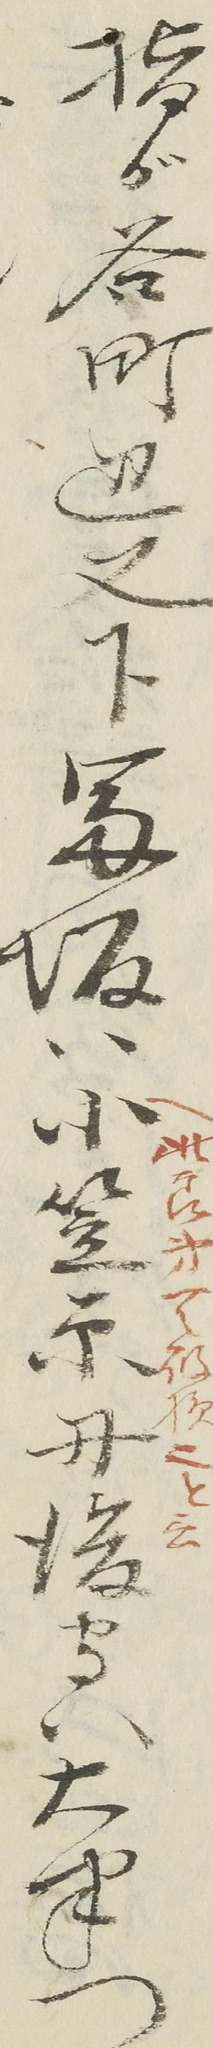指が谷町辺又下富坂ハ小笠原丹後守ハ大半つ
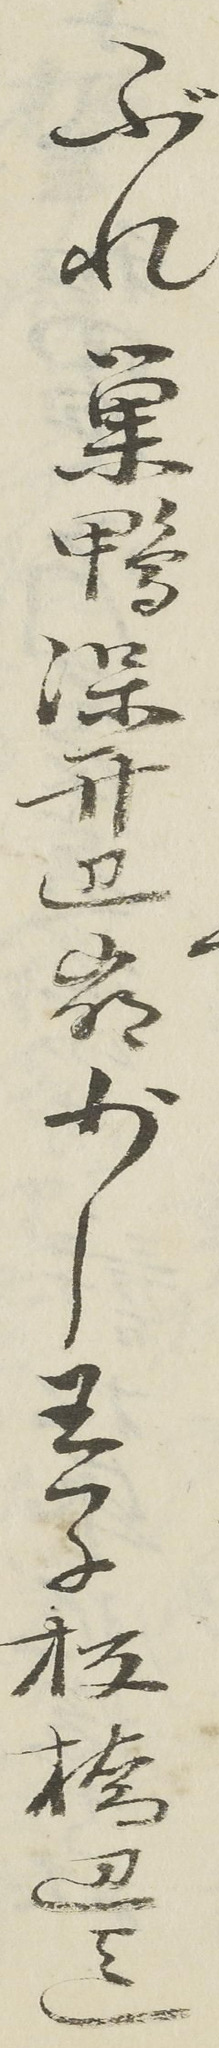ぶれ巣鴨染井辺崩少し王子板橋辺迄
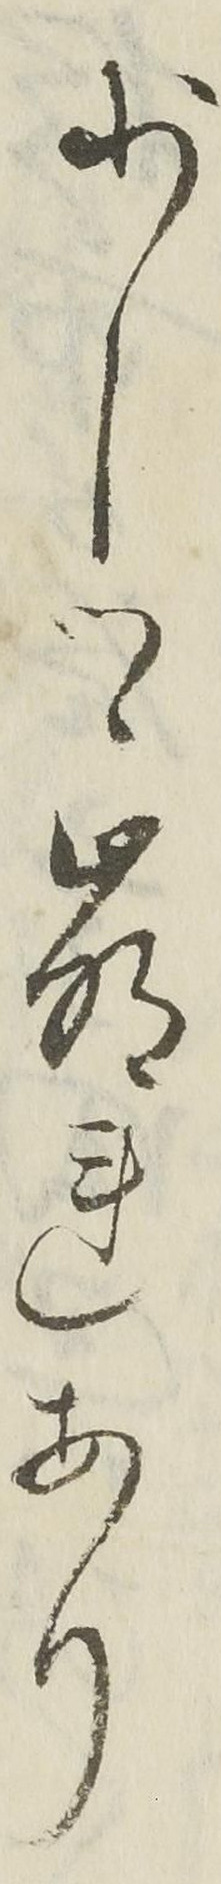少しつゝ崩れあり
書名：安政乙卯江戸大地震筆記　安政丙辰八月大阪大雷雨之記追加　安政三辰年七月松前辺大地震并八月大風雨記録
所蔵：東京大学地震研究所図書室 Earthquake Research Institute Library, The University of Tokyo, JAPAN
